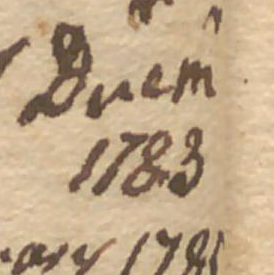1783
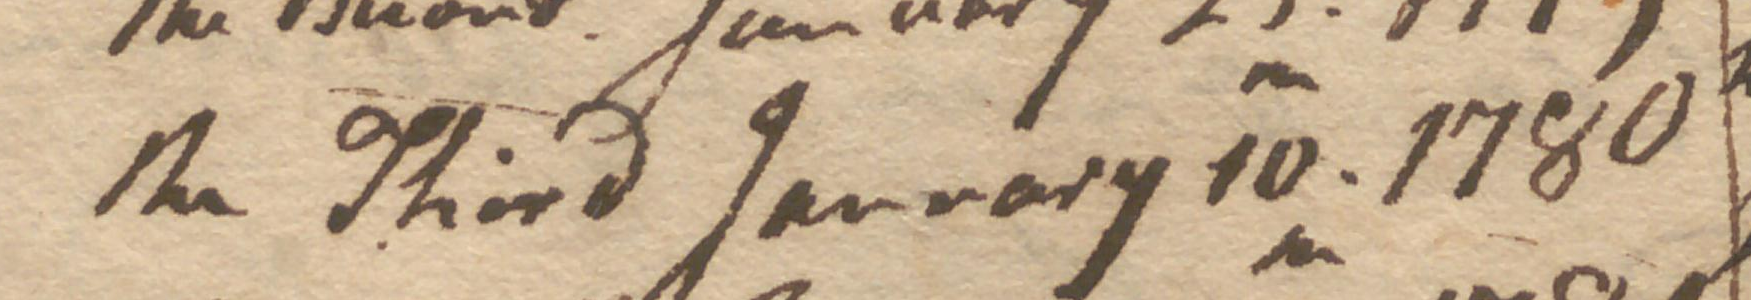the Third January 10^th. 1780
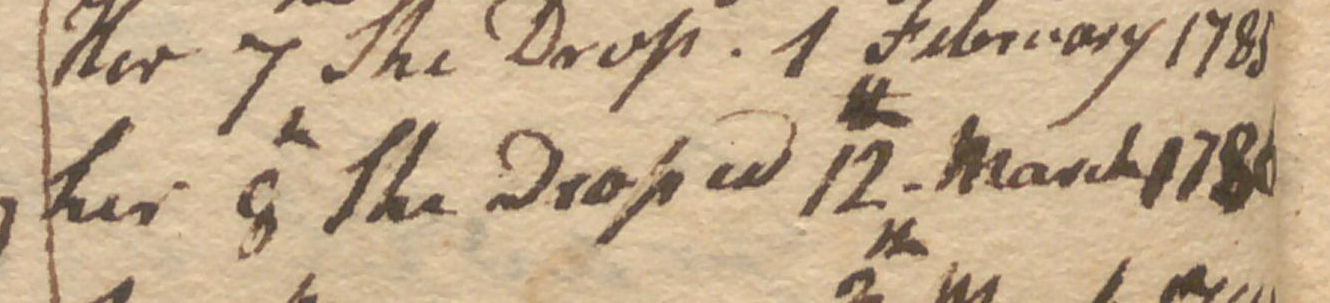her 8^th she Droped 12^th. Marc 178
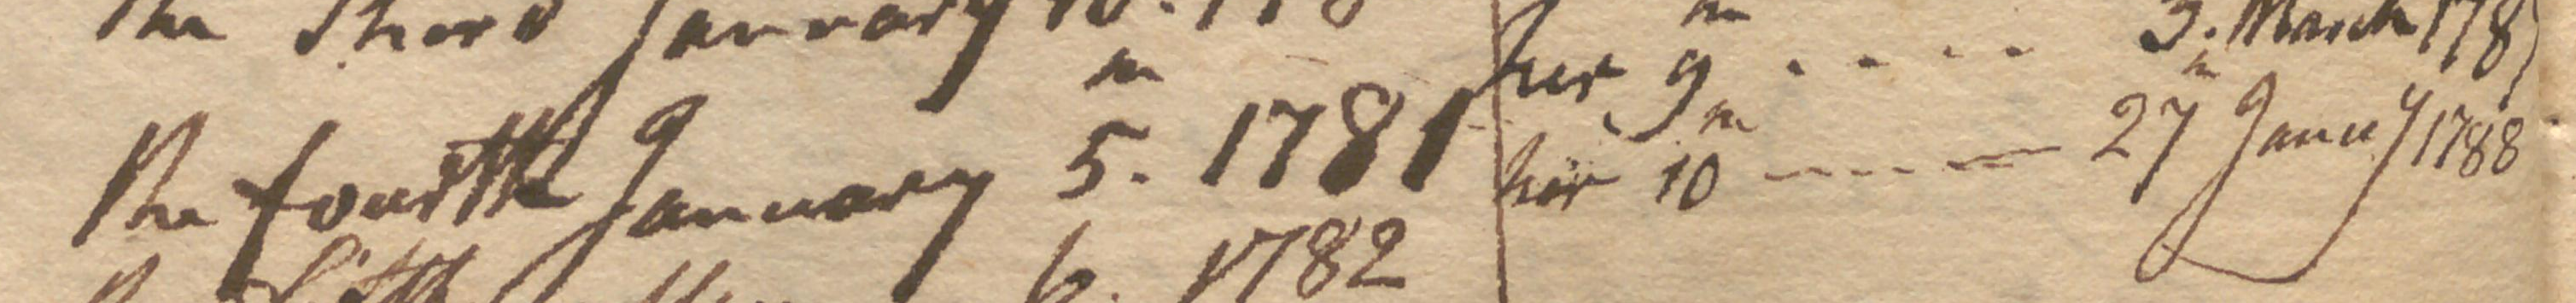the fourth January 5th. 1781 her 10^th------ 27 Janu^y 1788
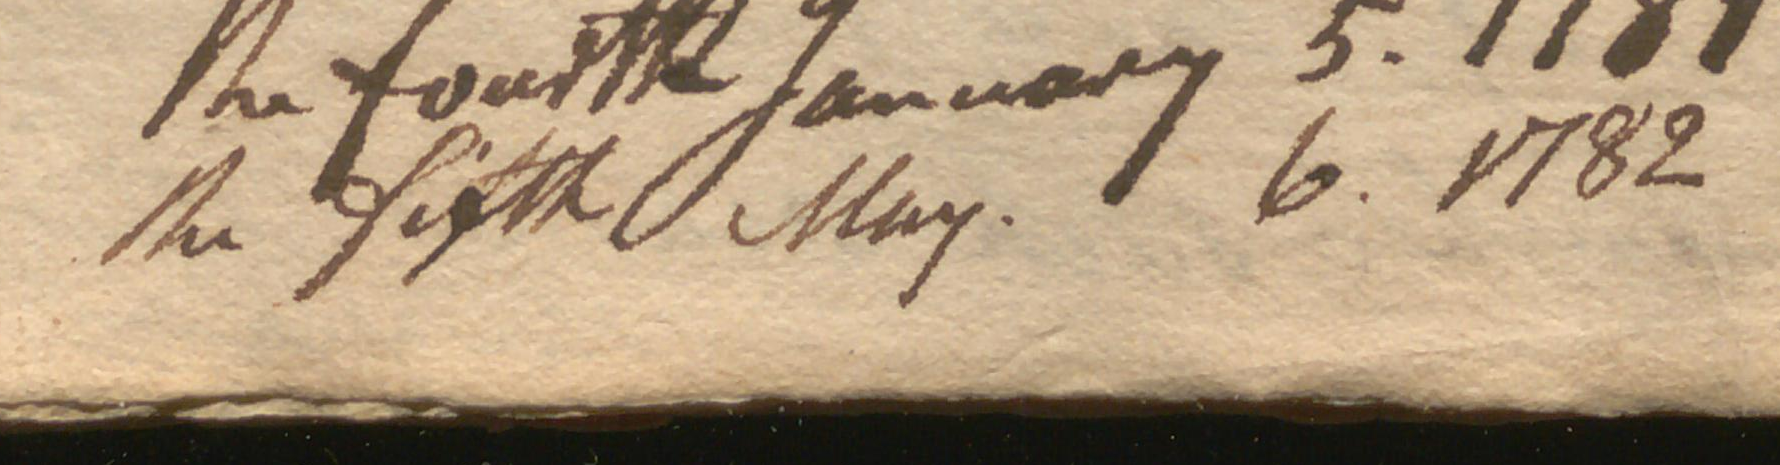the fifth May 6. 178l
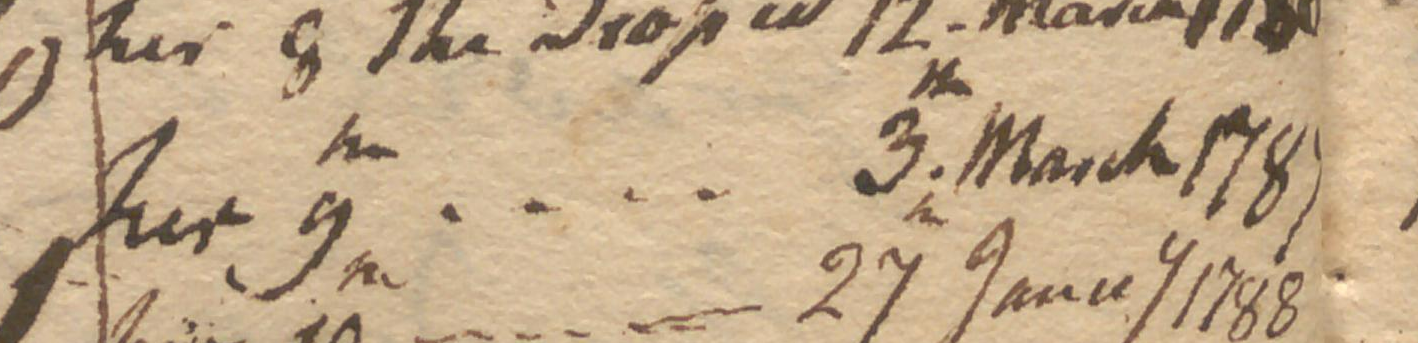her 9th.. 3^th. Marc 178.
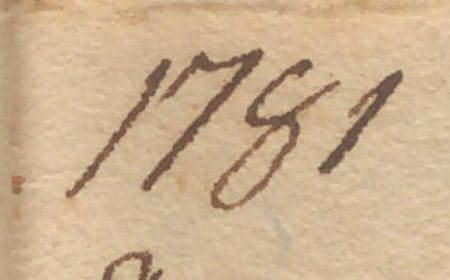1781
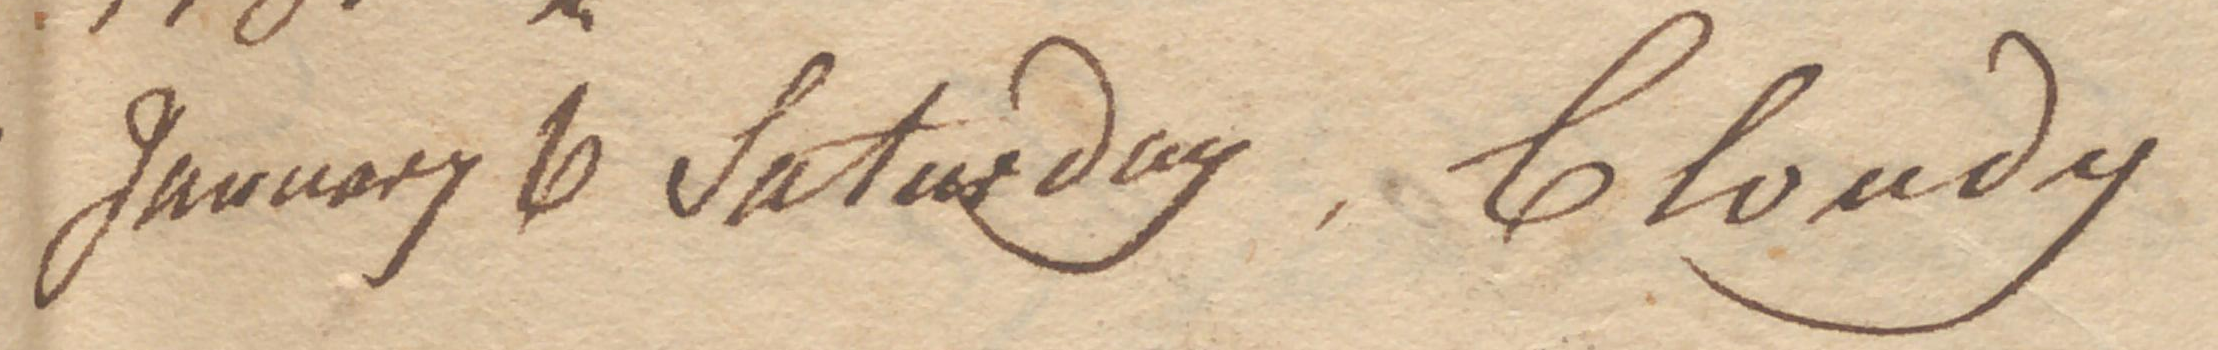January 6^th Saturday, Cloudy
